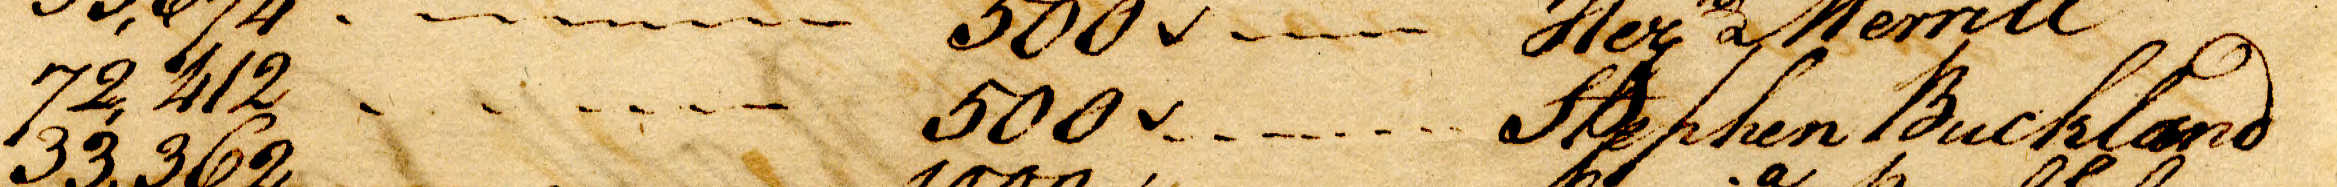1212--- 5000 Hhenthichtod
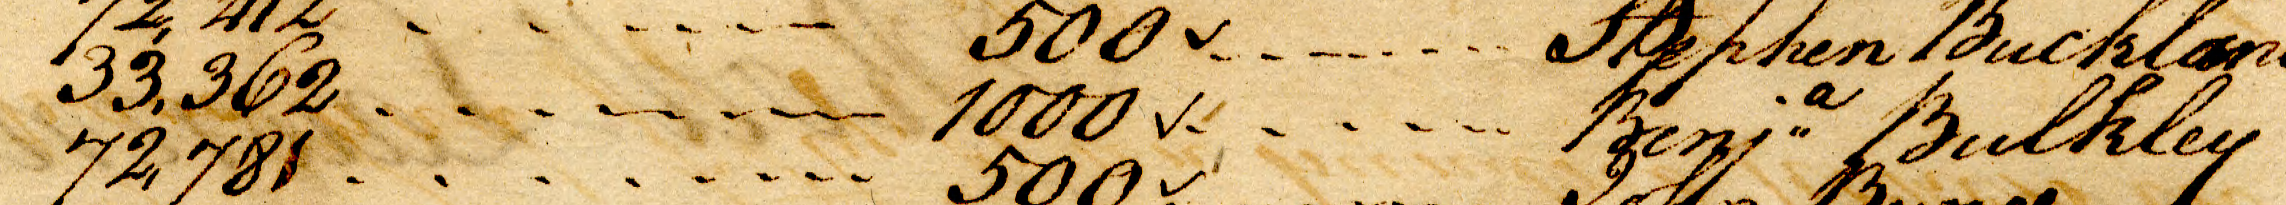33333---- 1000- Ben Bultiley
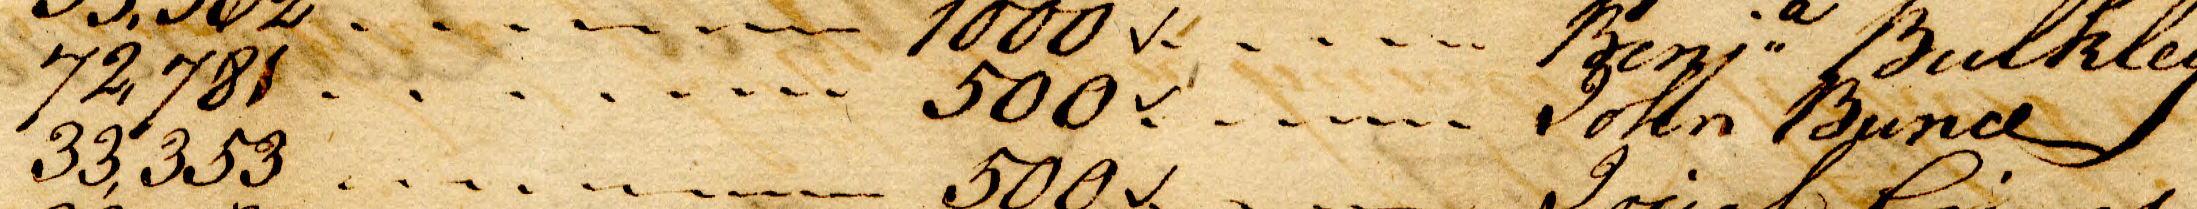778t------- 500------ Sotn Benct
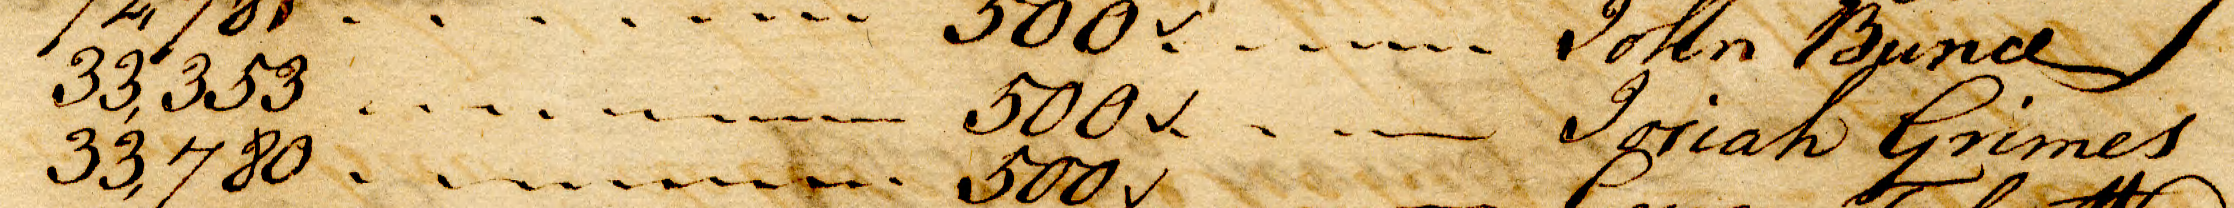3330----- 500- Ipiah Gotmet
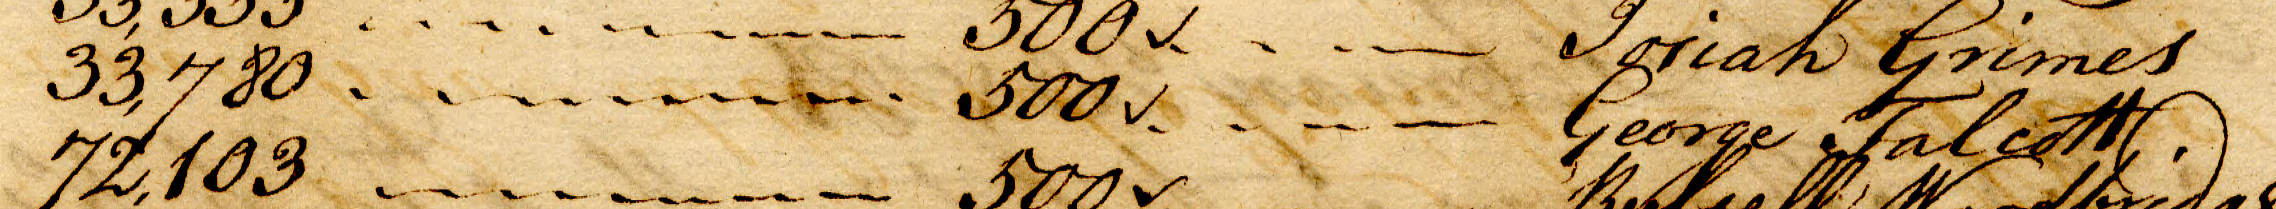33720- 500--- Goon Halec
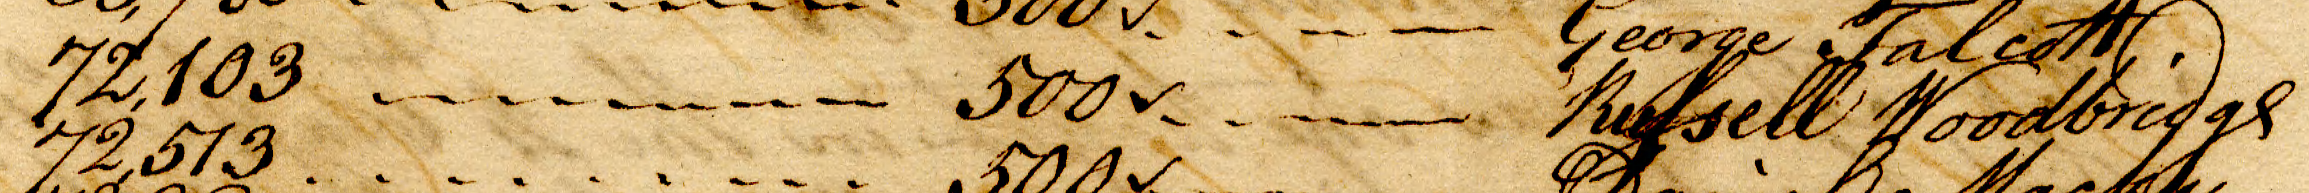12703------ 500- sill foos
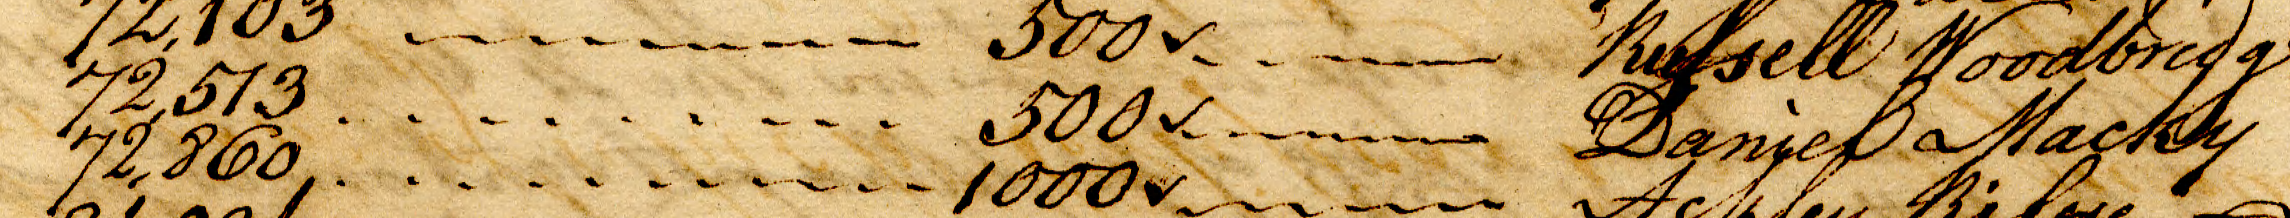1203----- 500- pos to
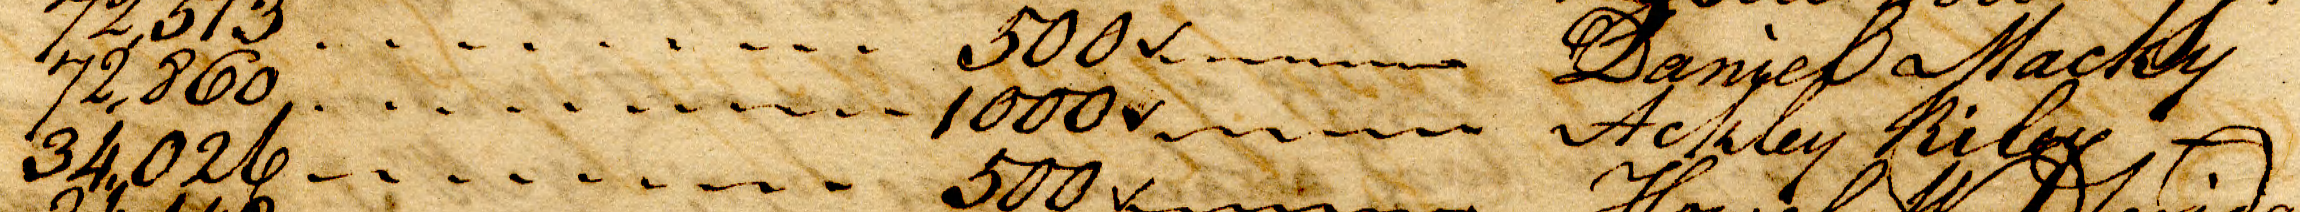12,00o---1000----- Tcpley Bil0e
